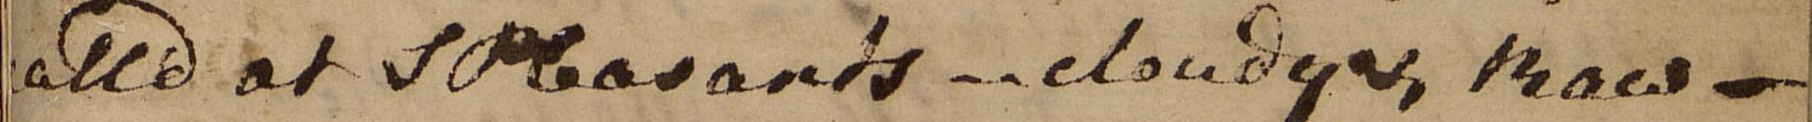all'd at S Pleasants- cloudy & raw-
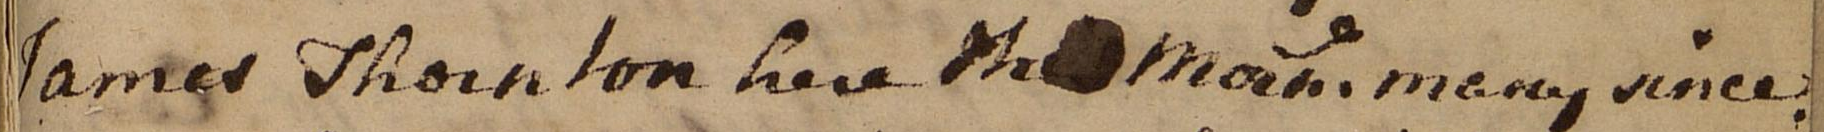James Thornton here this Morn.^g many since
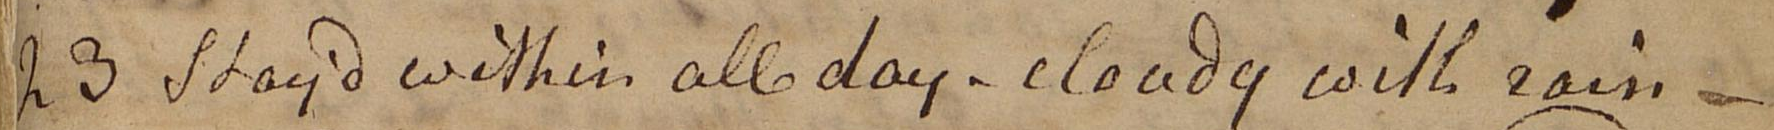23 Stay'd within all day-cloudy with rain-
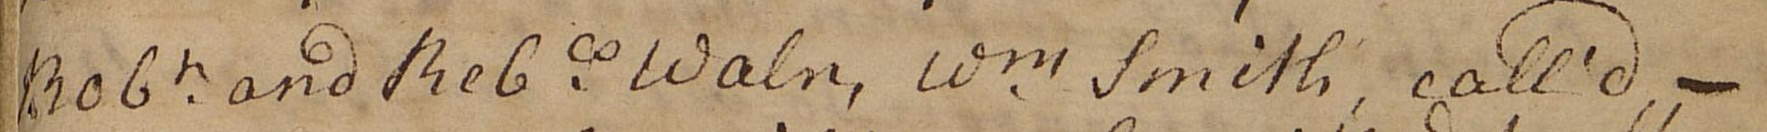Rob^t and Reb.^a Waln, W^m. Smith, call'd-
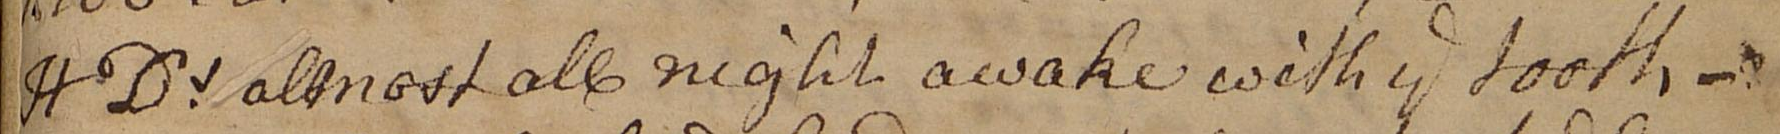HD^s almost all night awake with y^e tooth-
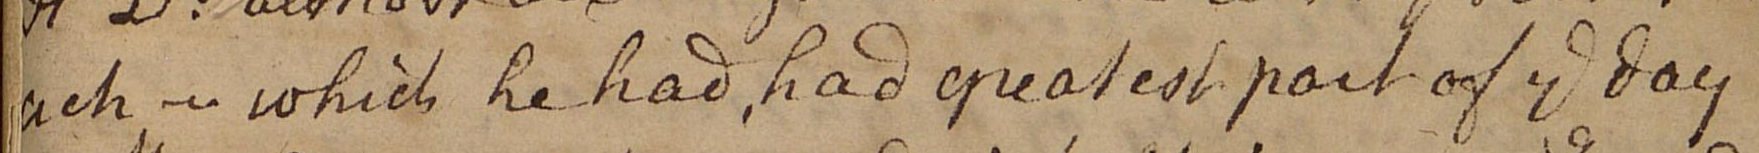ach- which he had, had greatest part of y^e day
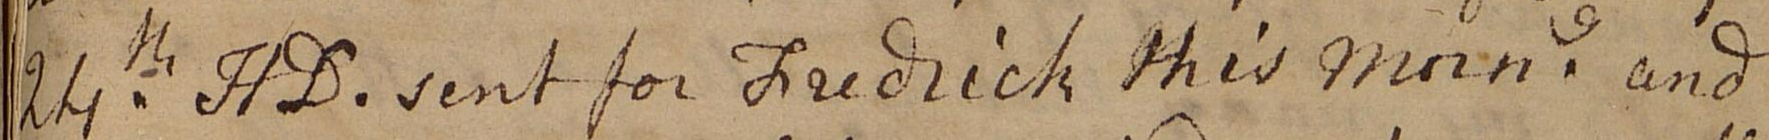24^th. H D. sent for Fredrick this Morn.^g and
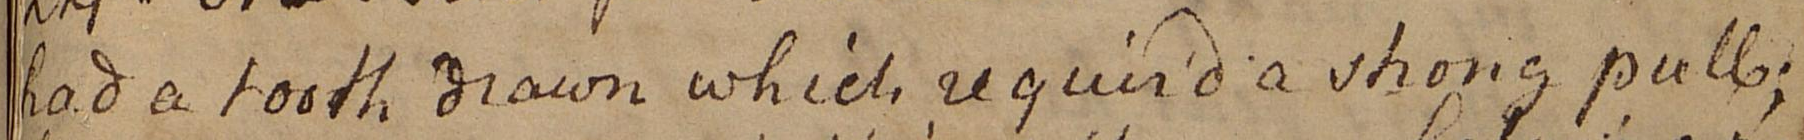had a tooth drawn which requir'd a strong pull;
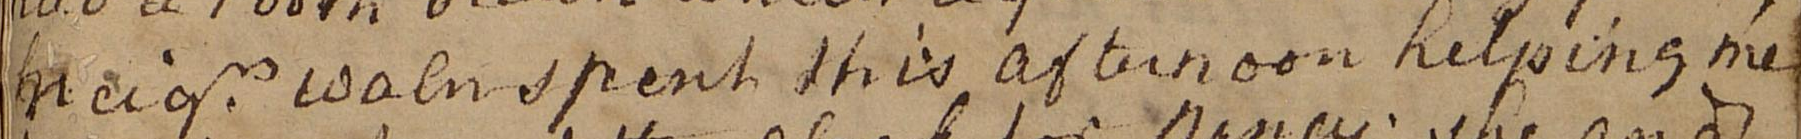Neig^r. Waln spent this afternoon helping me
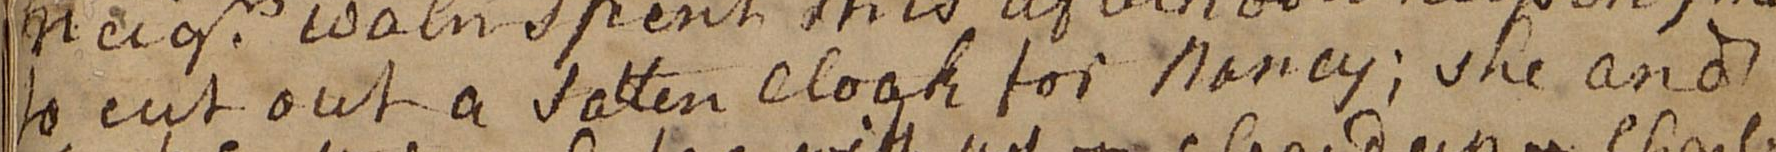to cut out a Satten cloak for Nancy; she and
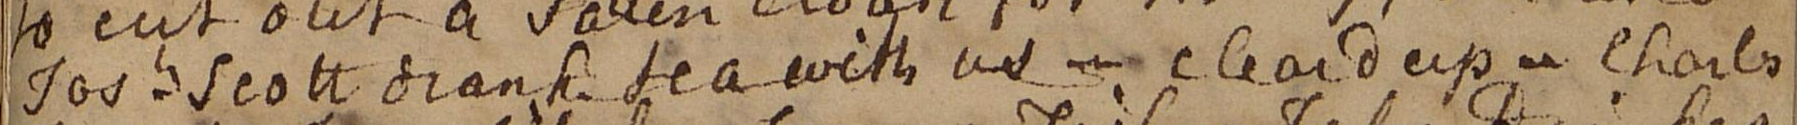Jos.^h Scott drank tea with us- clear'd up- Charls
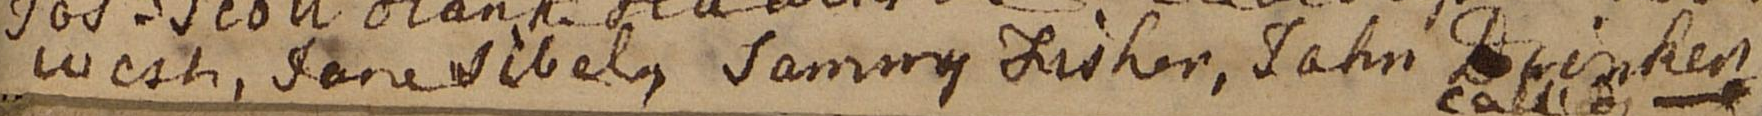wesh, Jane Sibely Sammy Fisher, Jahn Drinker
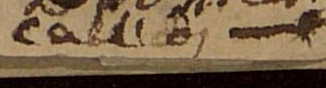call'd-
